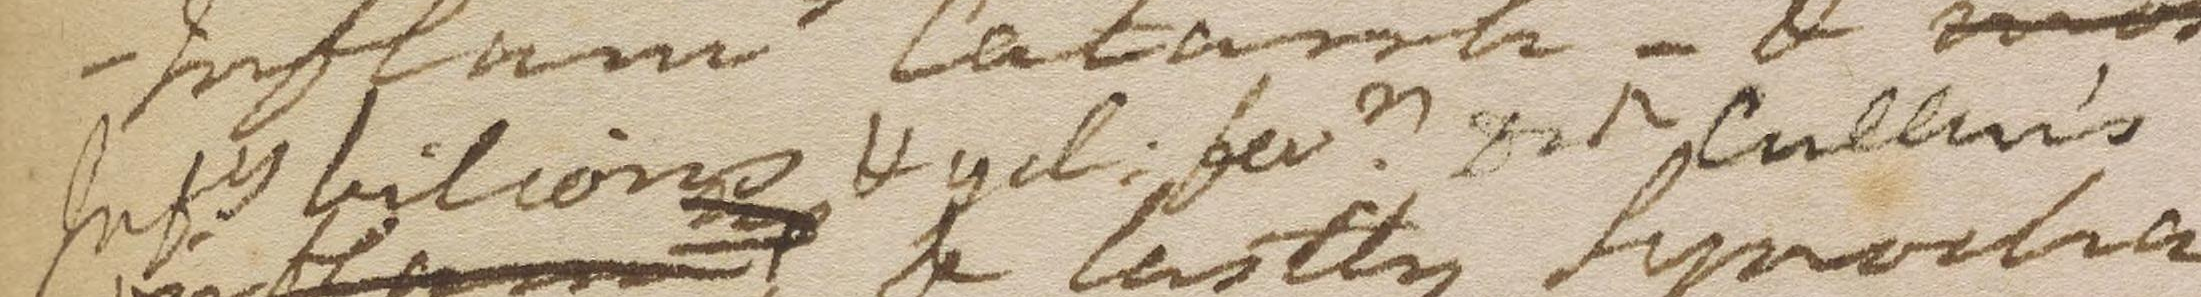Inf^y bilious & yel. fev. D^r Cullen's
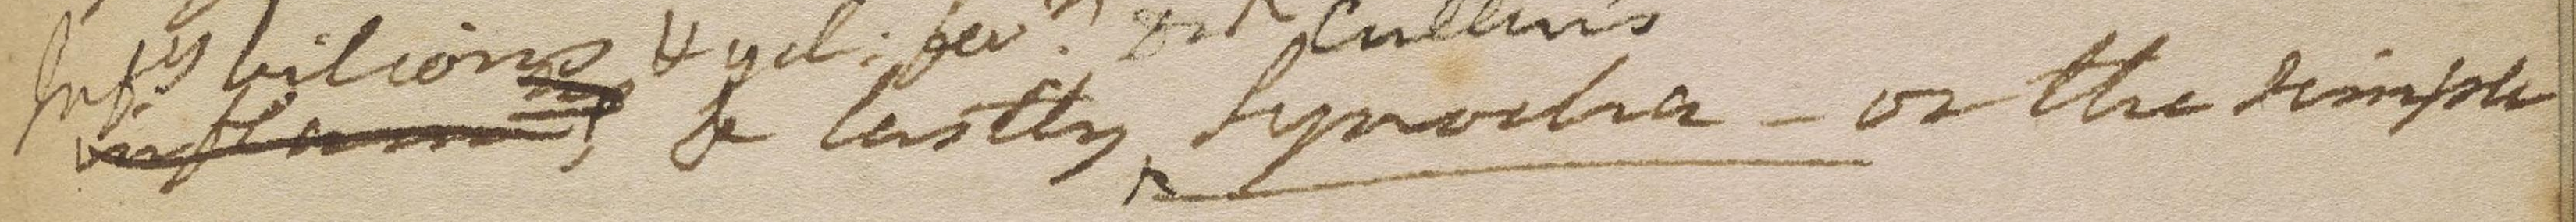[inflam] & lastly ^ Synocha- or the simple
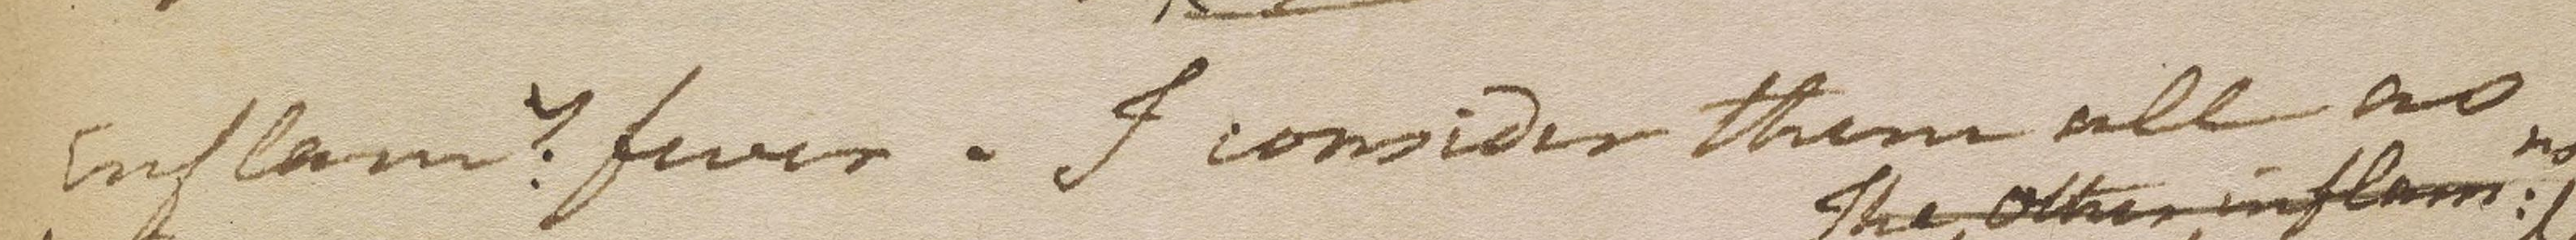inflam^y fever. I consider them all as
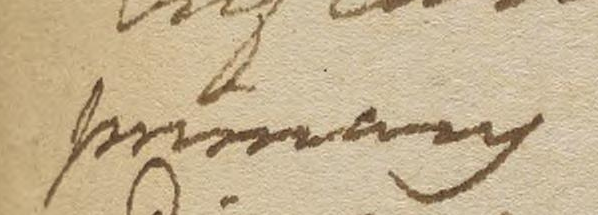primary
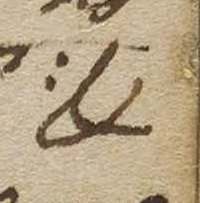&
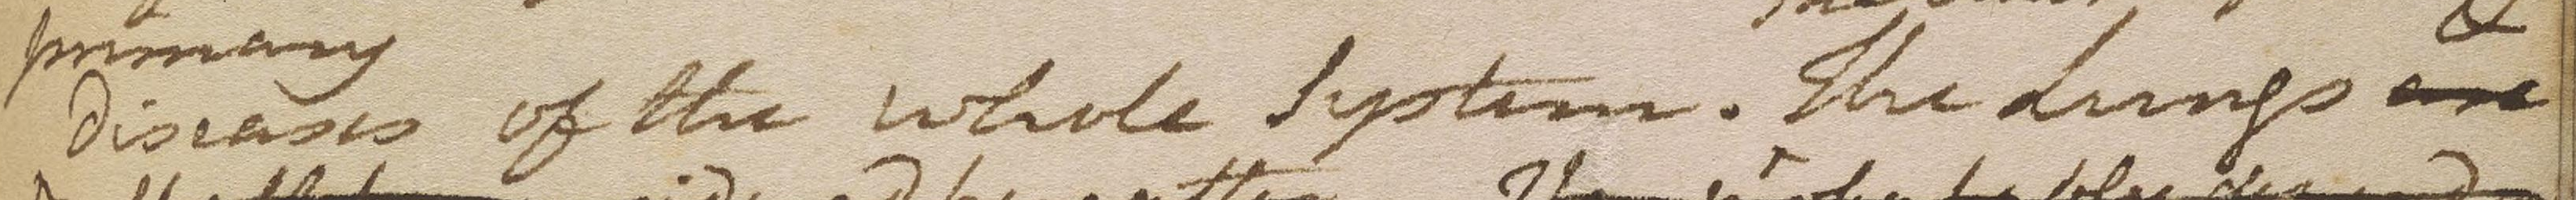diseases of the whole system. The Lungs are
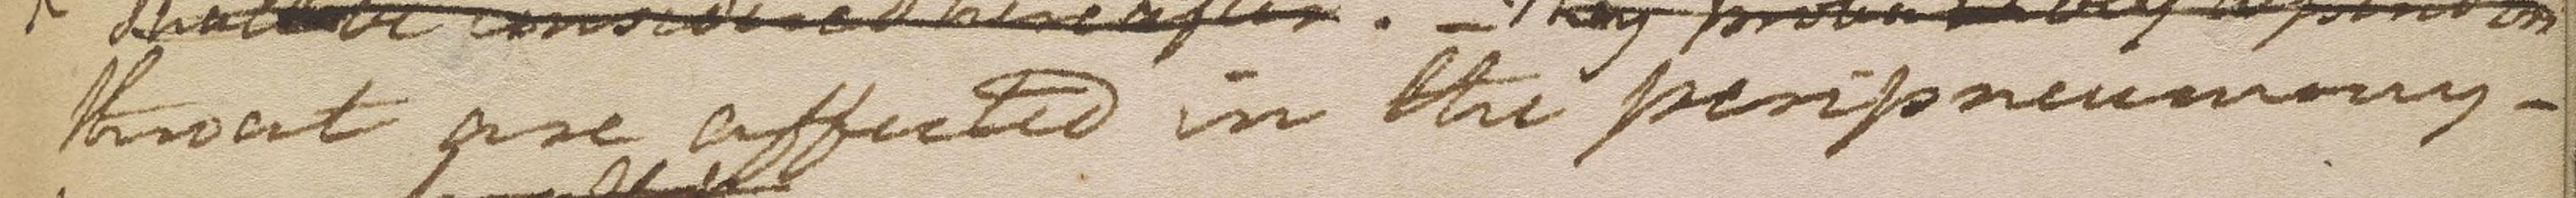throat are affected in the peripneumony,
